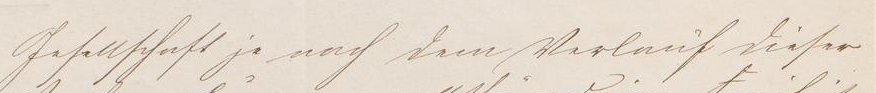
Gesellschaft je nach dem Verlauf dieser
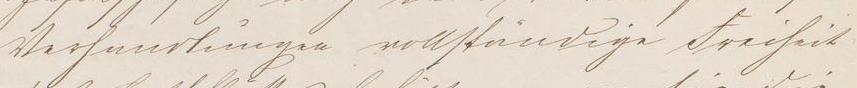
Verhandlungen vollständige Freiheit
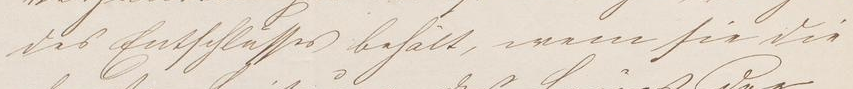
des Entschlusses behält, wem sie die
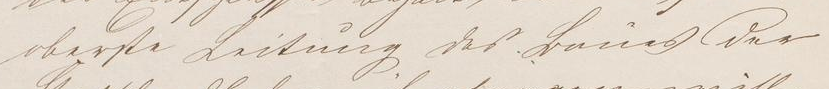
oberste Leitung des Baues der
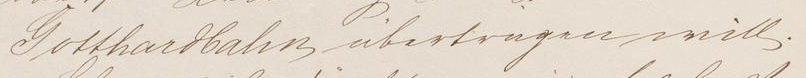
Gotthardbahn übertragen will.
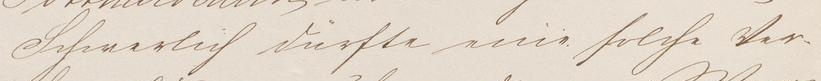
Schwerlich dürfte eine solche Ver-
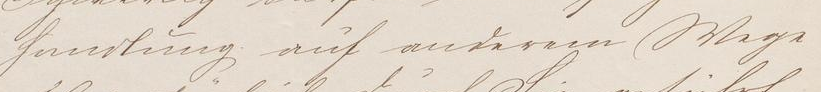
handlung auf anderem Wege
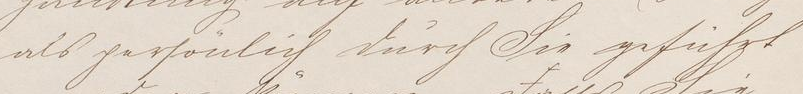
als persönlich durch Sie geführt
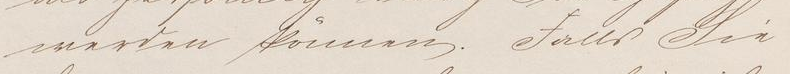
werden können. Falls Sie
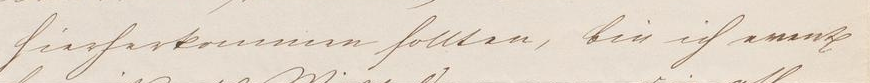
hierherkommen sollten, bin ich event
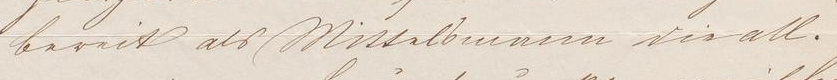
bereit als Mittelsmann die all-
